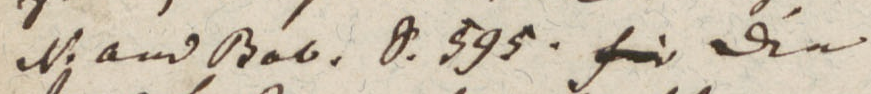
N. and Bab. S. 595. Für Die
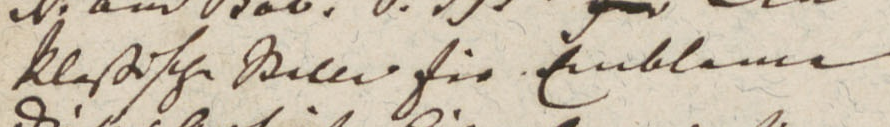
klassische Stelle für Embleme
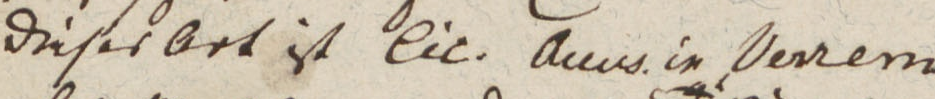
dieser Art ist Cic. Accus. in Verrem
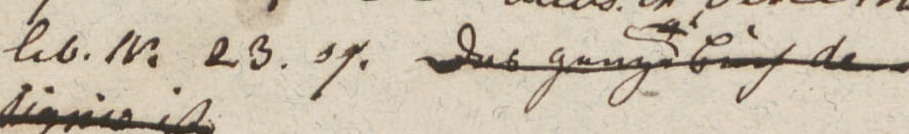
lib. IV. 23. sq. Das ganze 4t Buch de
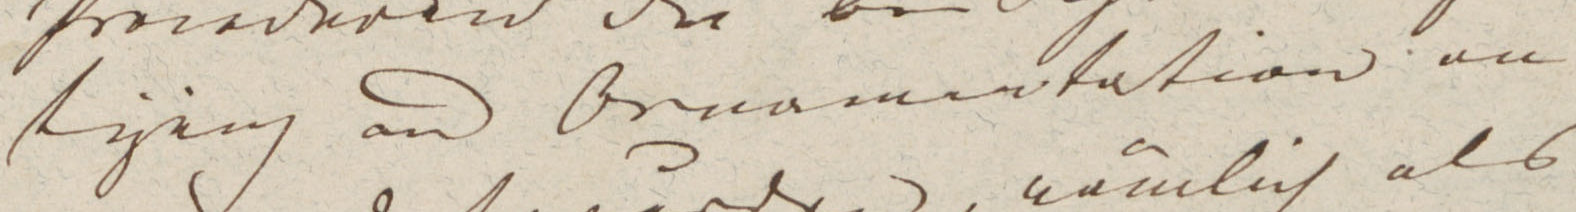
tigung und Ornamentation an-
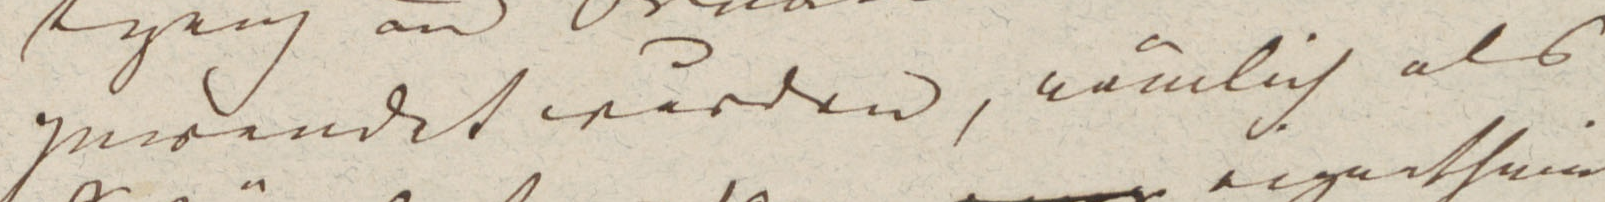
gewendet wurden, nämlich als
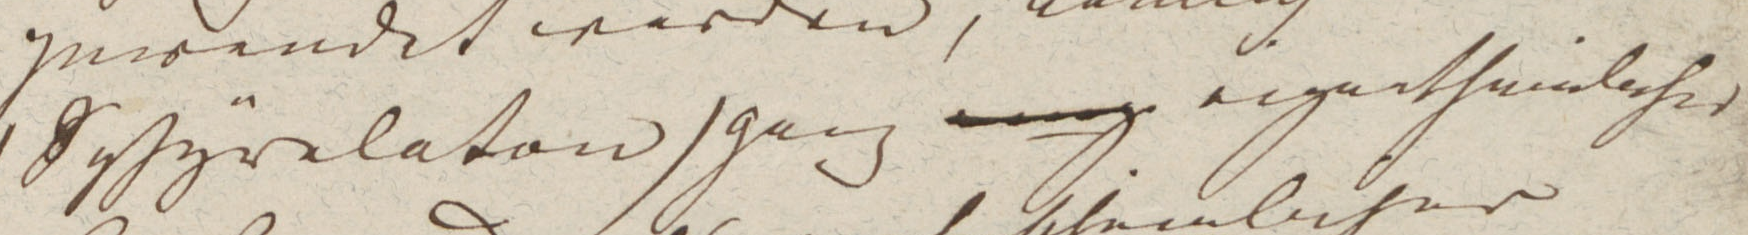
(Sphyrelaton) ganz eig eigenthümlicher
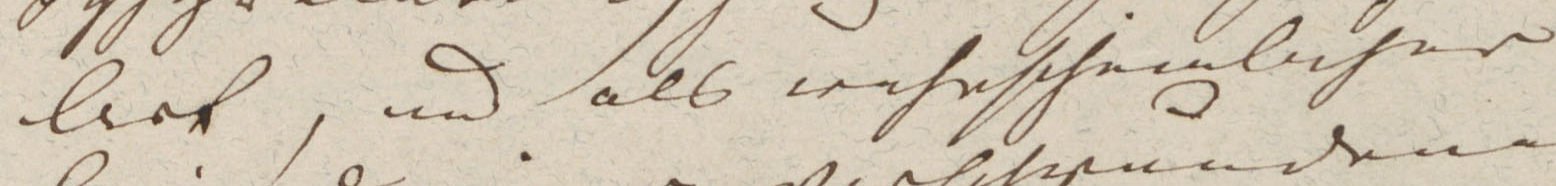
Art, und als wahrscheinlicher
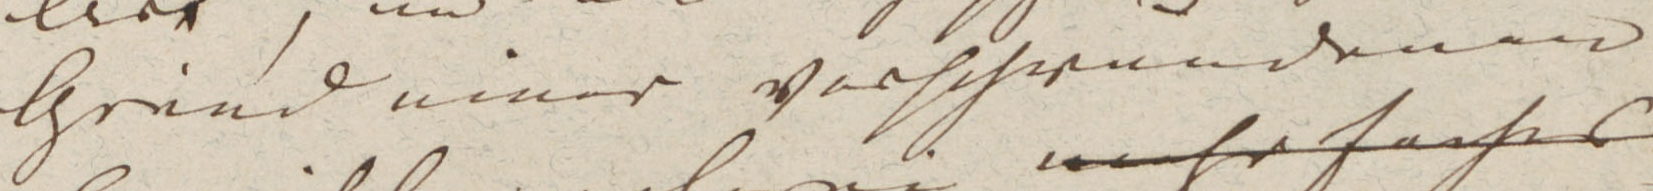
Grund einer verschwundenen
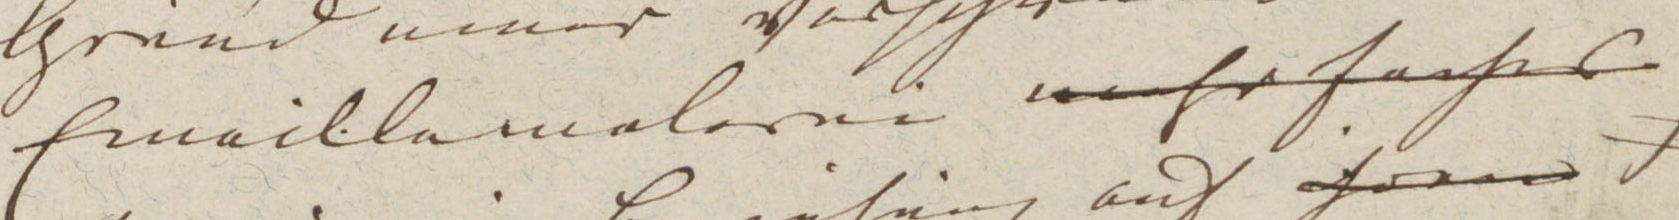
Emaillemalerei mehrfaches
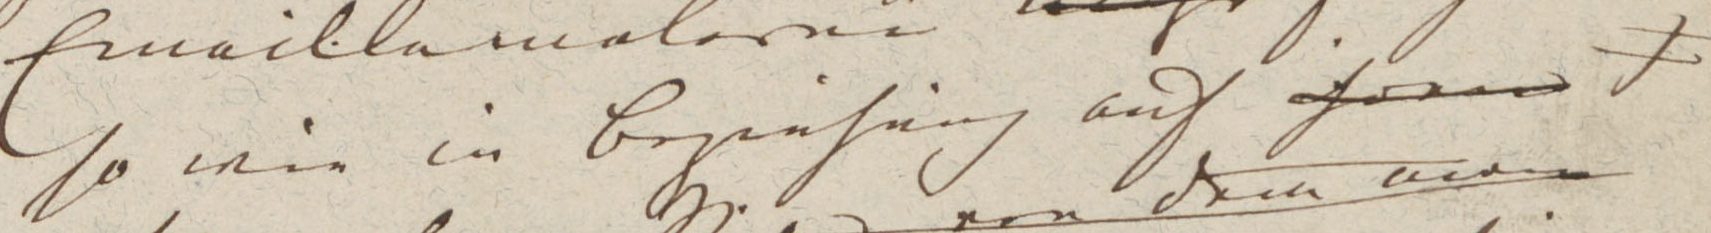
so wie in Beziehung auf ihren %
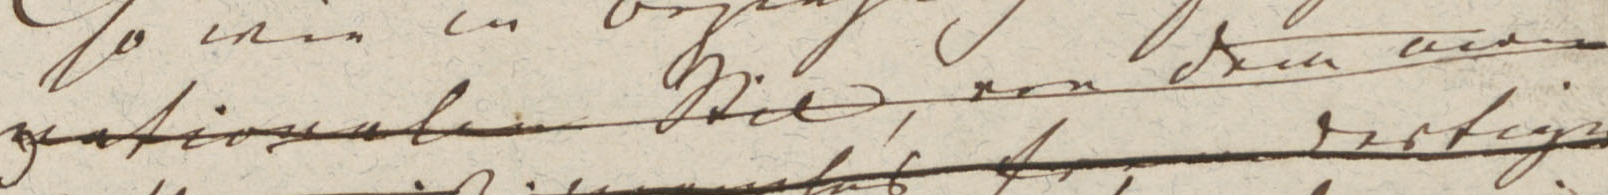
nationalen Stil, von dem man
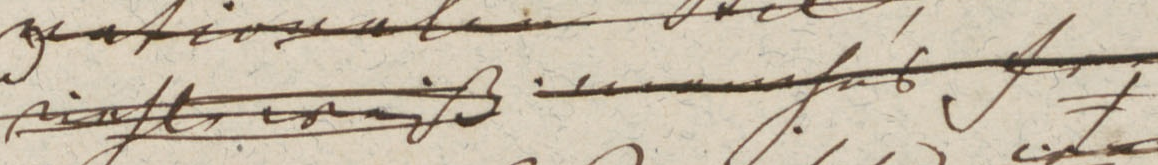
nicht weiss manches Fremdartige
